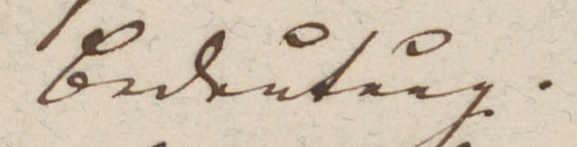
Bedeutung.
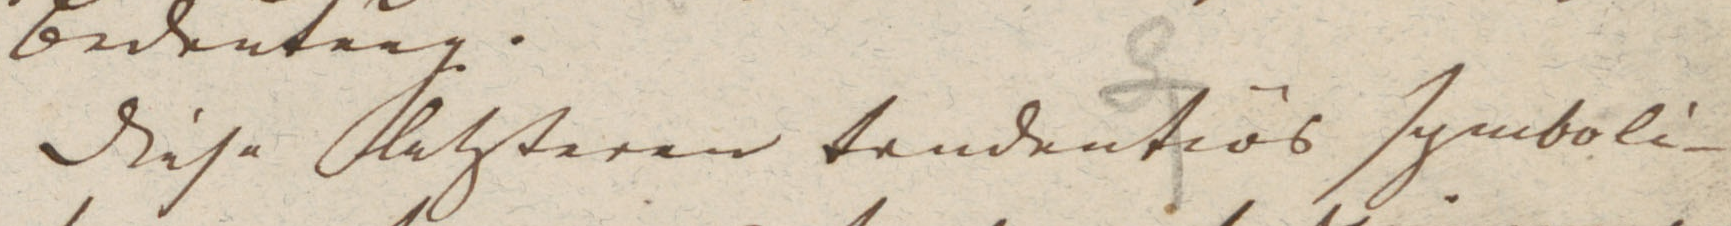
Diese letzteren tendentziös symboli-
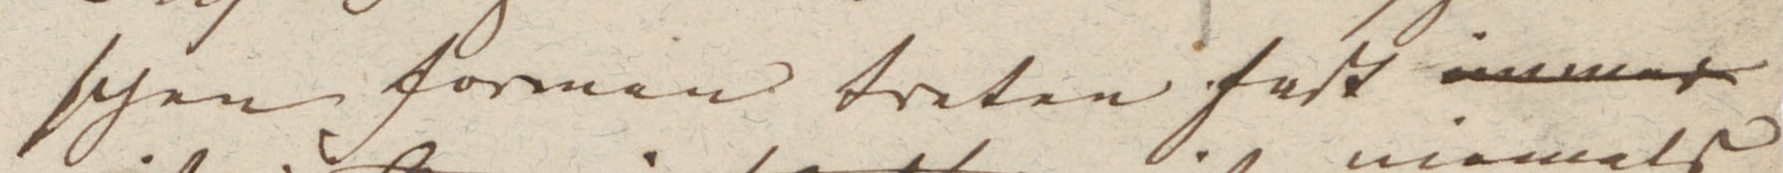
schen Formen treten fast immer
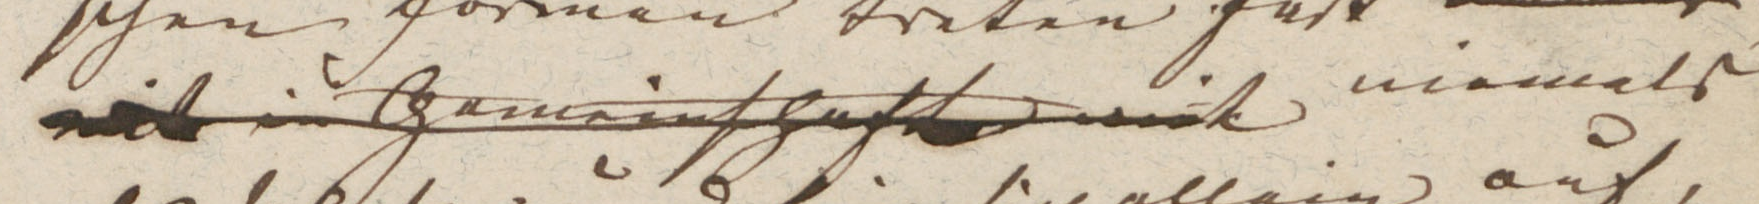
mit in Gemeinschaft mit niemals
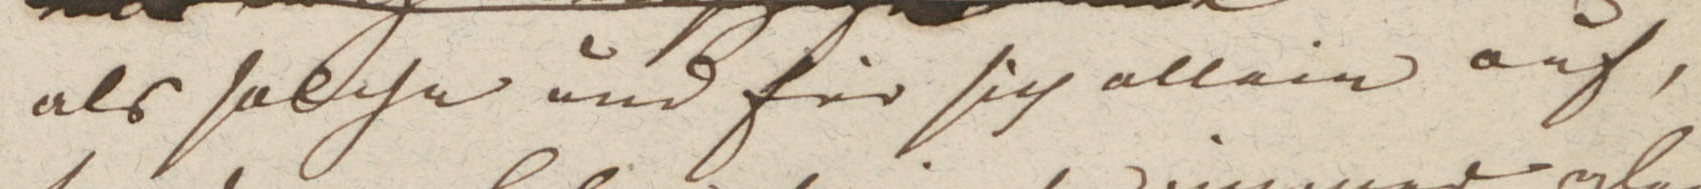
als solche und für sich allein auf,
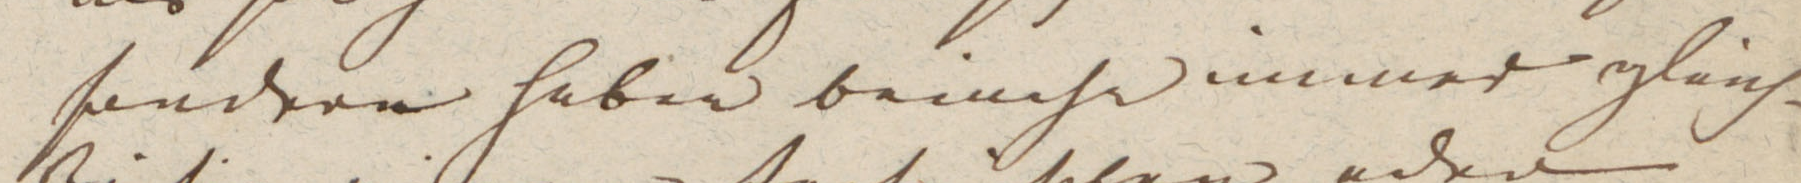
sondern haben beinahe immer gleich-
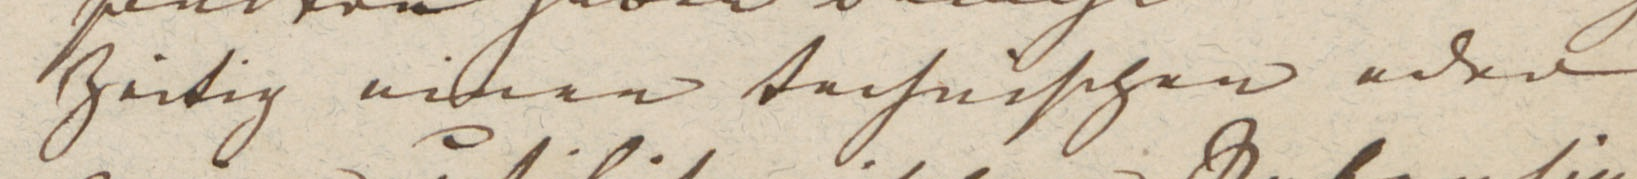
zeigig einen technischen oder
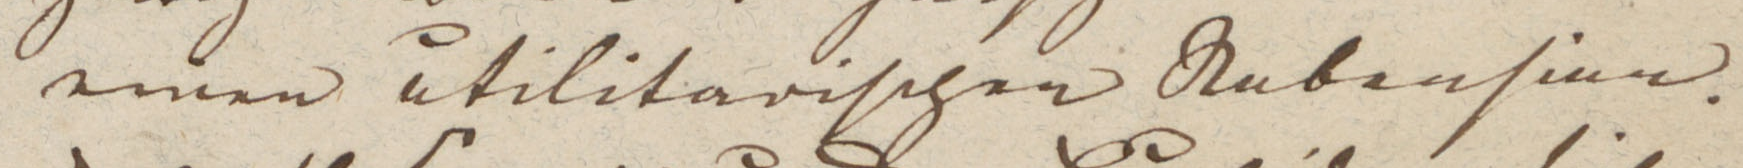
einen utilitarischen Nebensinn.
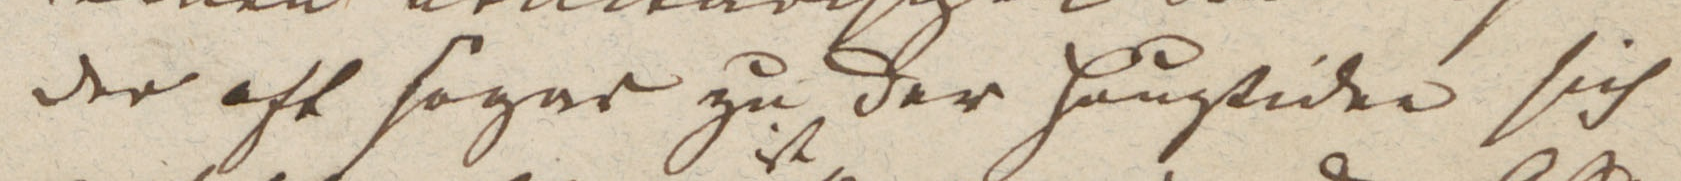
Der oft sogar zu der Hauptidee sich
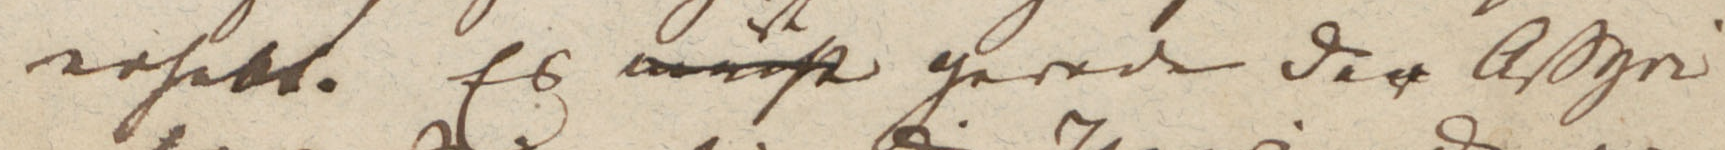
erhebt. Es macht ist gerade denr Assyri-
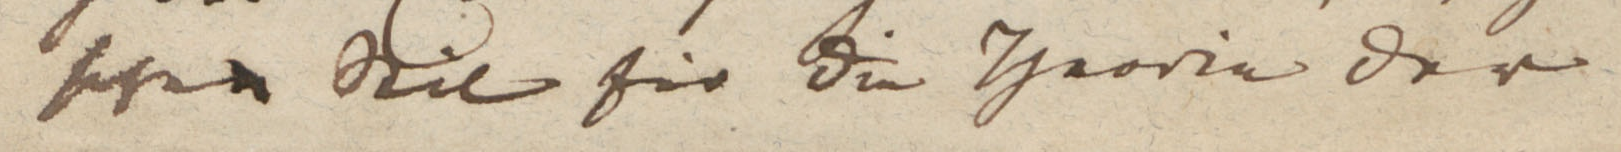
schen Stil für die Theorie der
